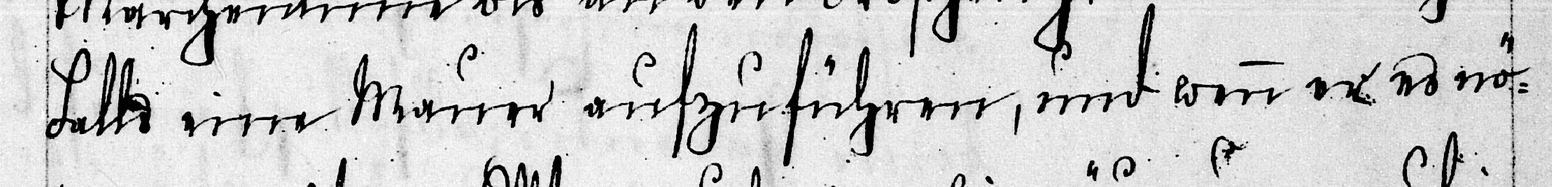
Falls eine Mauer aufzuführen, und wenn er es nö¬
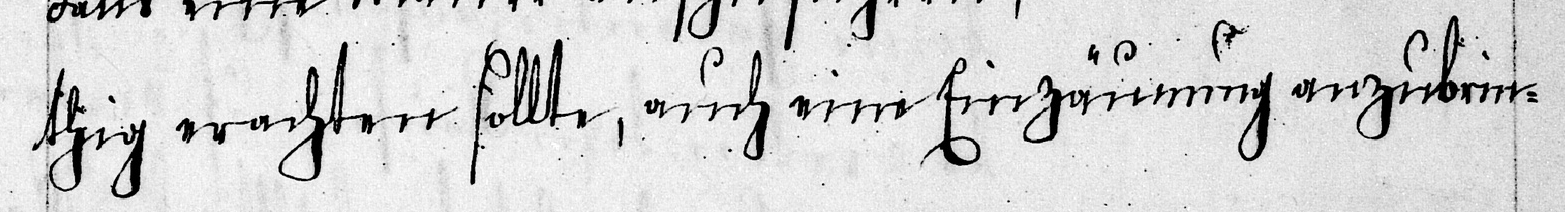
thig erachten sollte, auch eine Einzäunung anzubrin¬
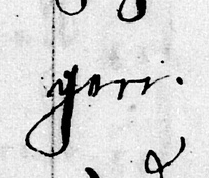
gen.
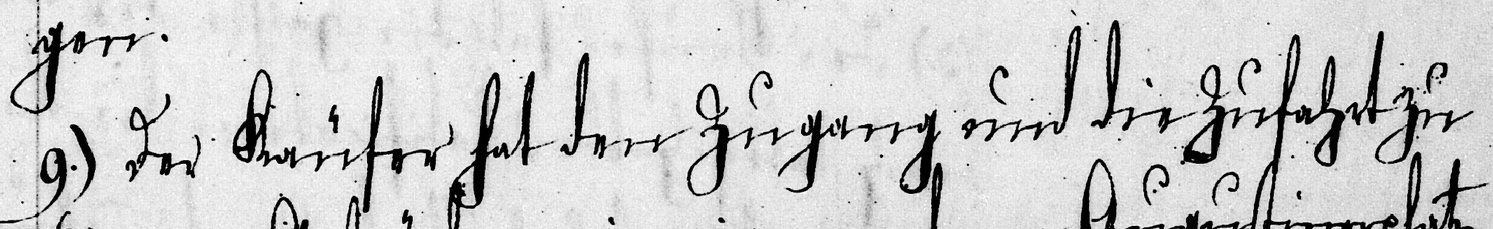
9.) Der Käufer hat den Zugang und die Zufahrt zu
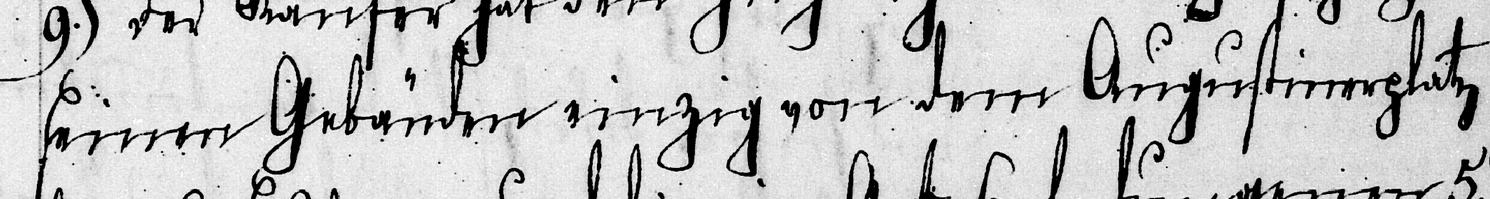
seinen Gebäuden einzig von dem Augustinerplatz
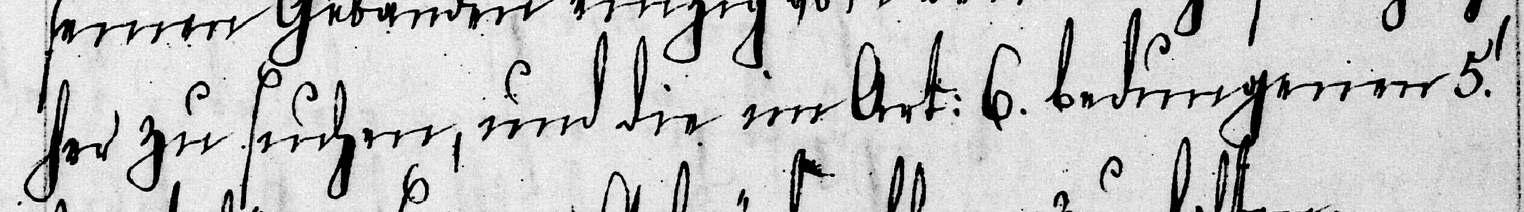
her zu suchen, und die im Art: 6. bedungenen 5’.
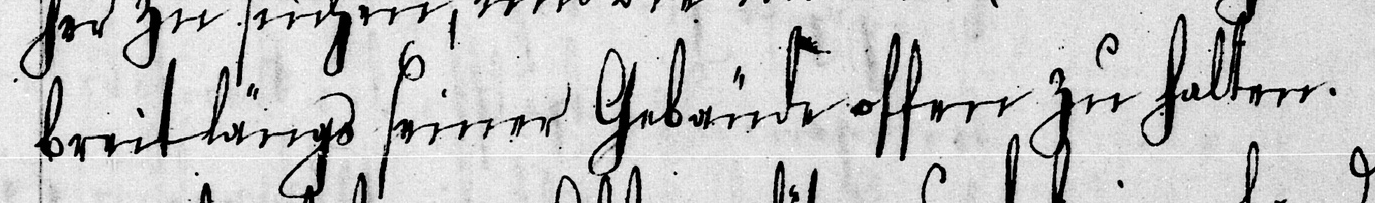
breit längs seiner Gebäude offen zu halten.
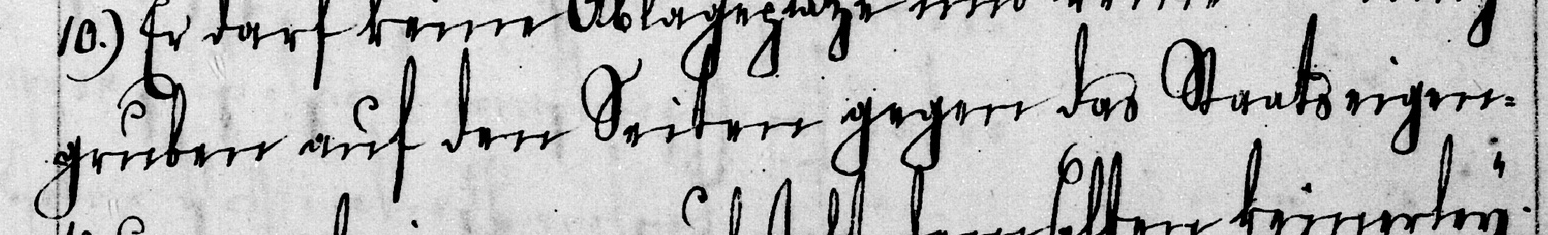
gruben auf den Seiten gegen das Staatseigen¬
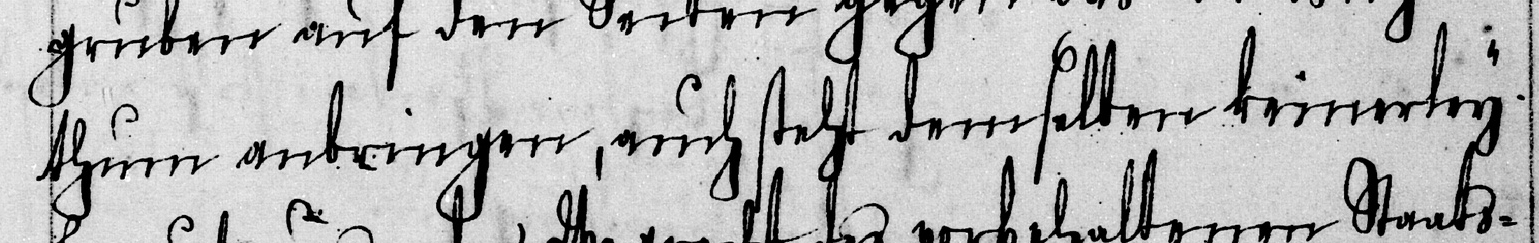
thum anbringen, auch steht demselben keinerley
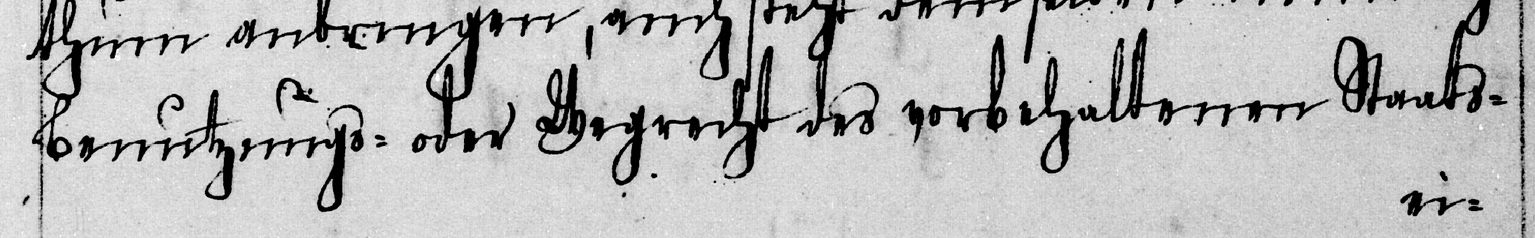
Benutzungs- oder Wegrecht des vorbehaltenen Staats-
